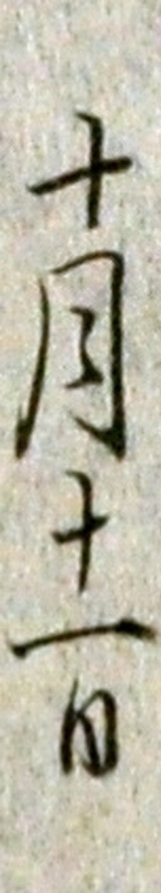十月十一日
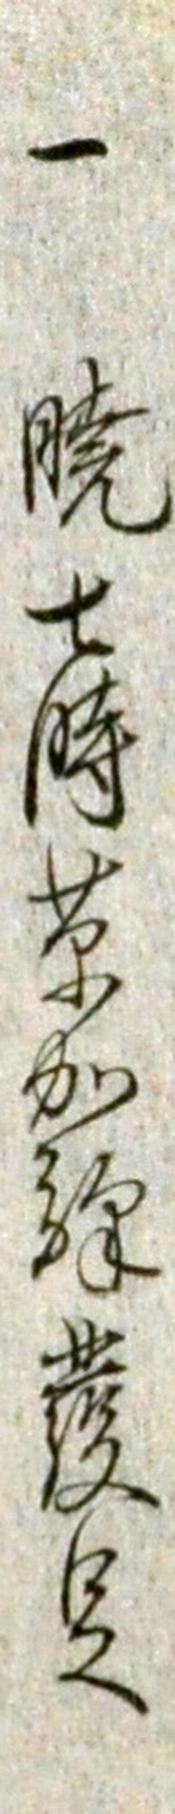一暁七時草加駅発足

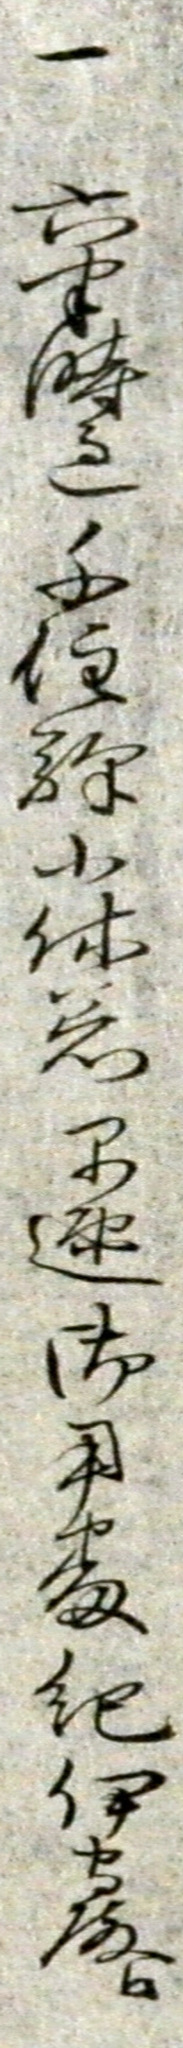一六半過千住駅小休着早速御用番伊豆守殿江
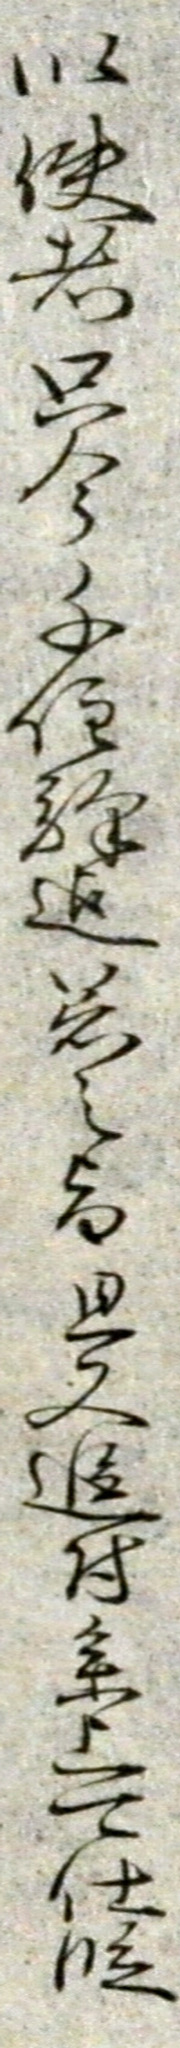以使者只今千住駅迠着之旨且又追付参上可仕段
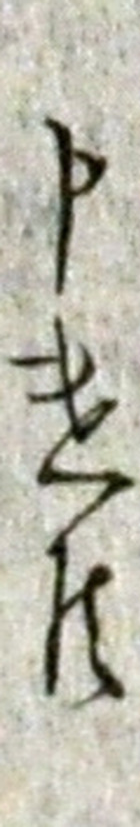申遣候
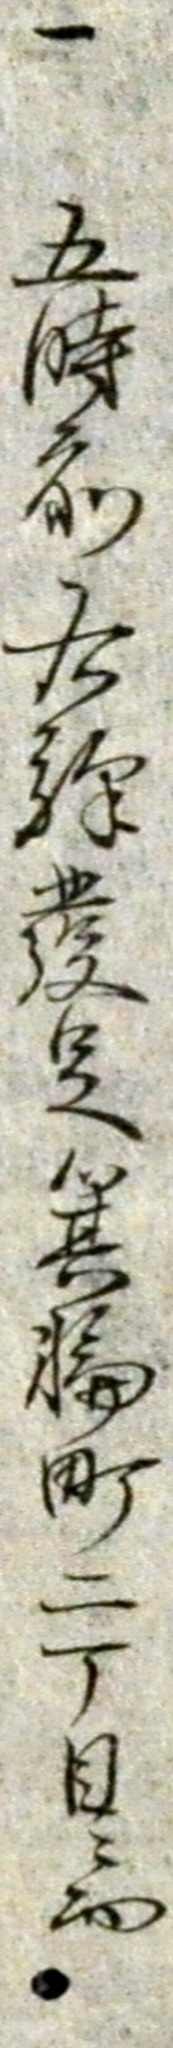一五時前右駅発足箕輪町二丁目ニ而
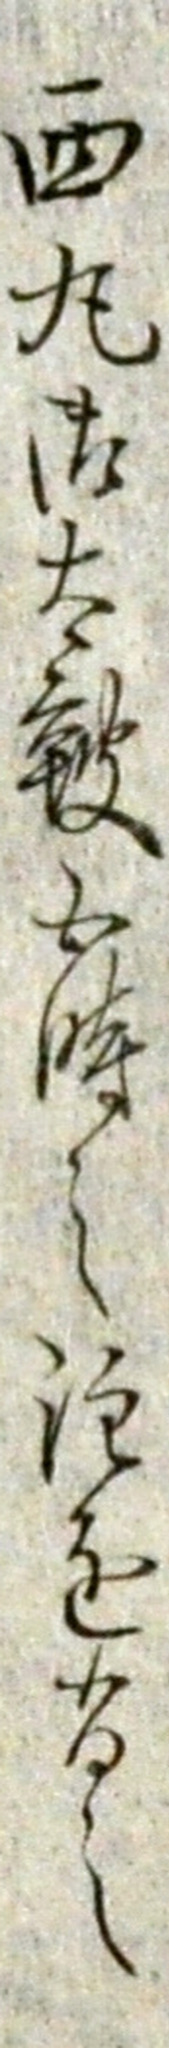西丸御太鼓五時之注進有之
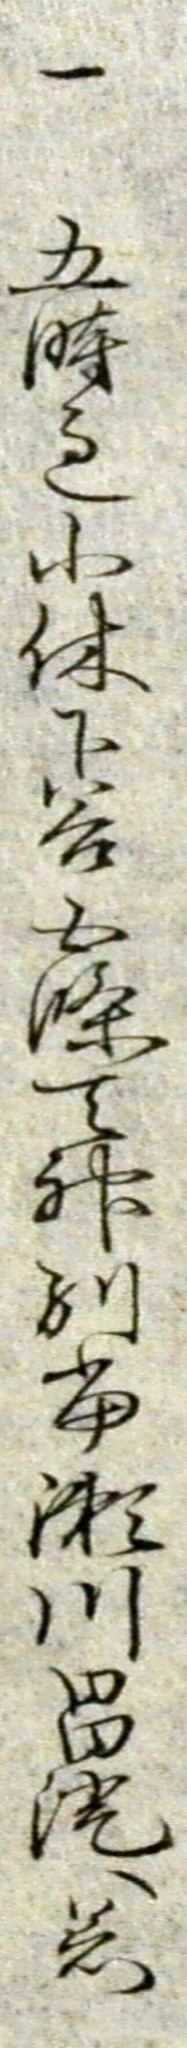一五時過小休下谷五條天神別当瀬川昌院へ着
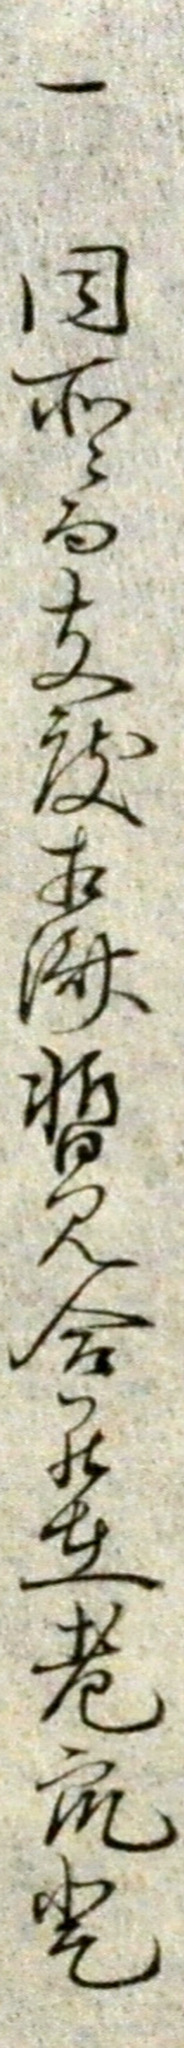一同所ニ而支度相済暫見合罷在老衆登
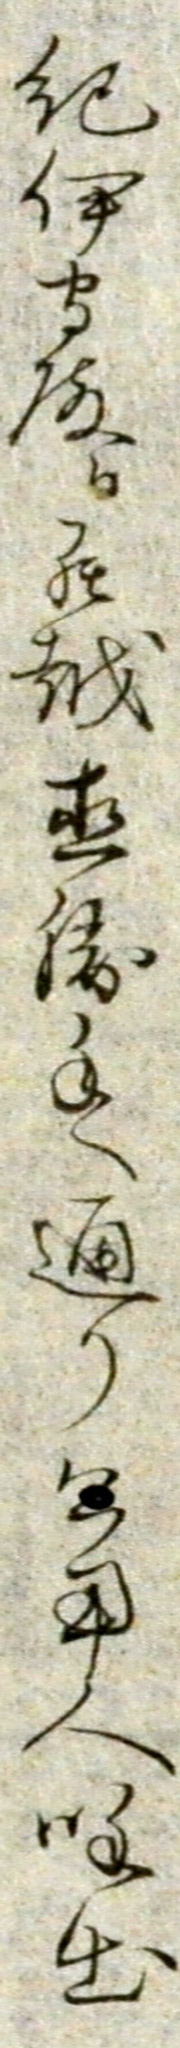紀伊守殿江罷越直勝手へ通り公用人呼出
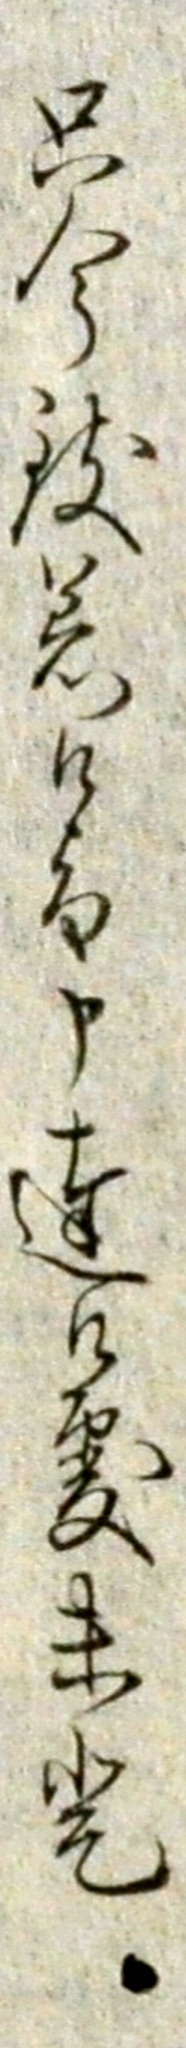只今致着候旨申達候処未登
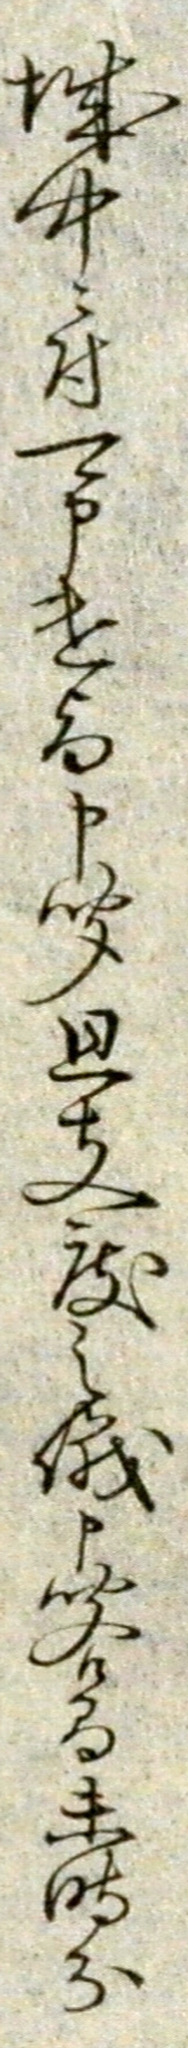城中ニ付可申遣旨申聞且支度之儀申聞候間未時分
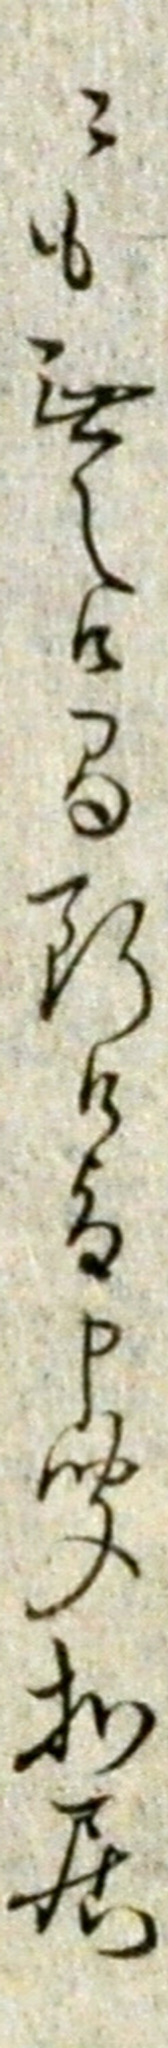ニも無之候間断候旨申聞扣居
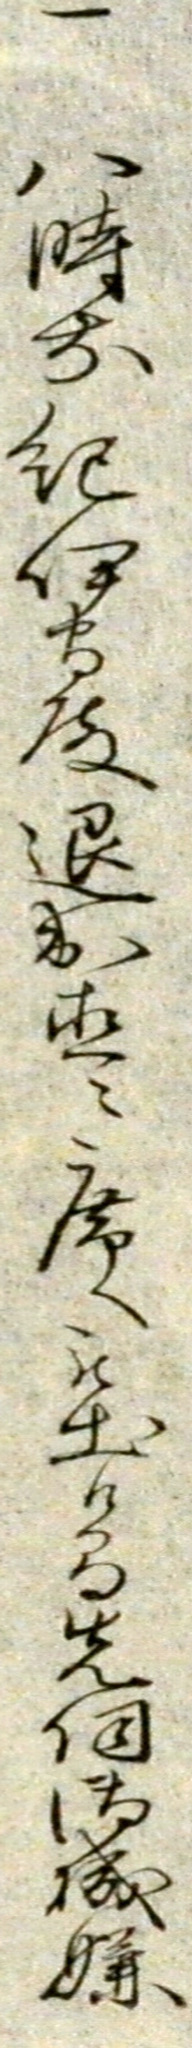一八時前紀伊守殿退出直ニ席へ罷出候間先伺御機嫌
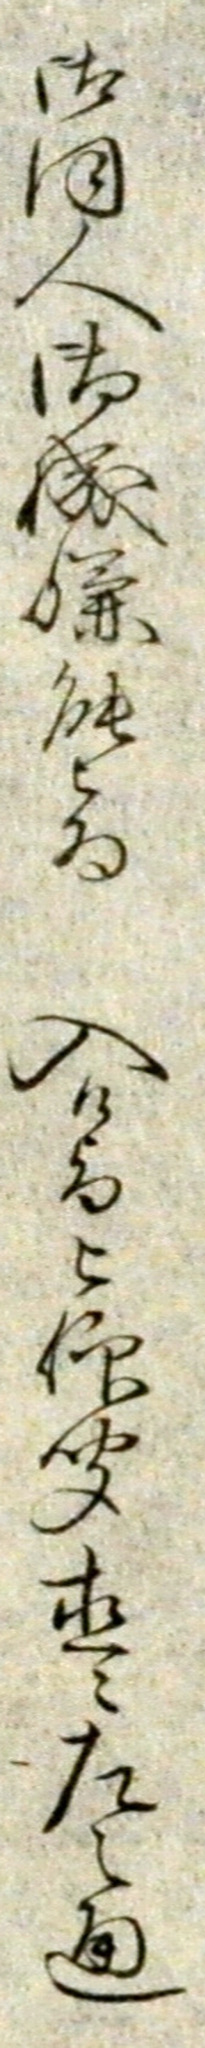御同人御機嫌能被為入候旨被仰聞直ニ左之通
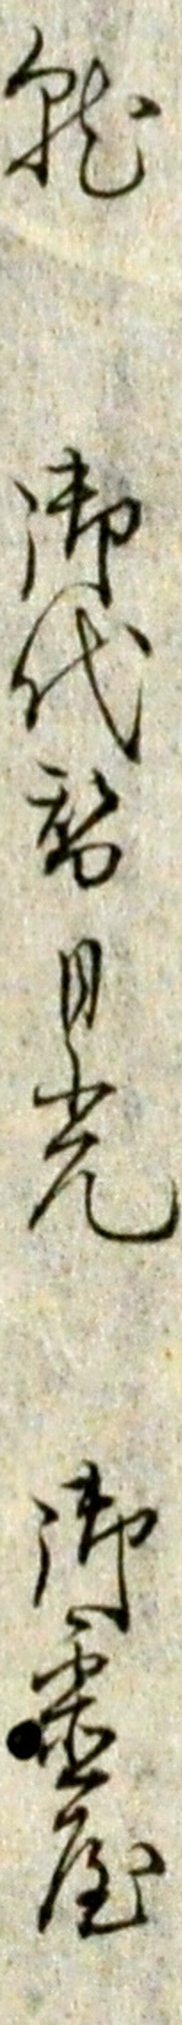就御代替日光御霊屋
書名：日光御名代相勤候節ノ留
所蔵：伊那市立高遠町図書館・合同会社AMANE
